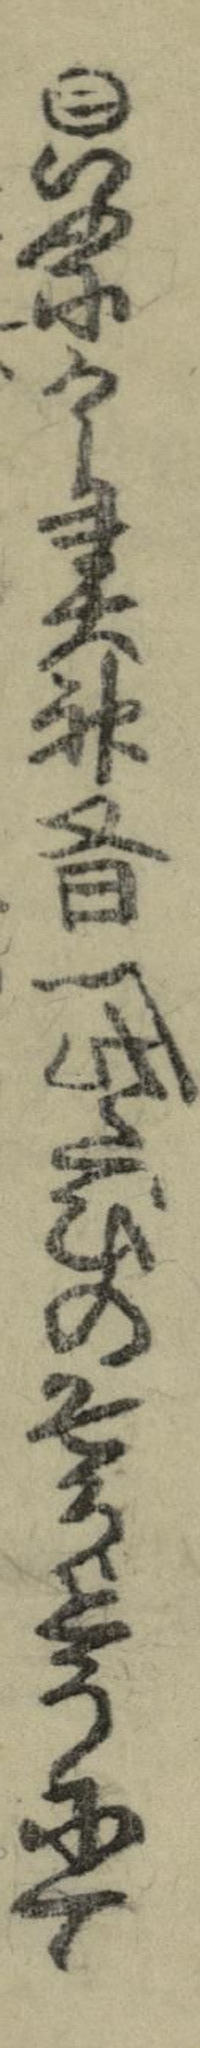㊀いふにかしま大神又曰〽此たひのそうどうにて
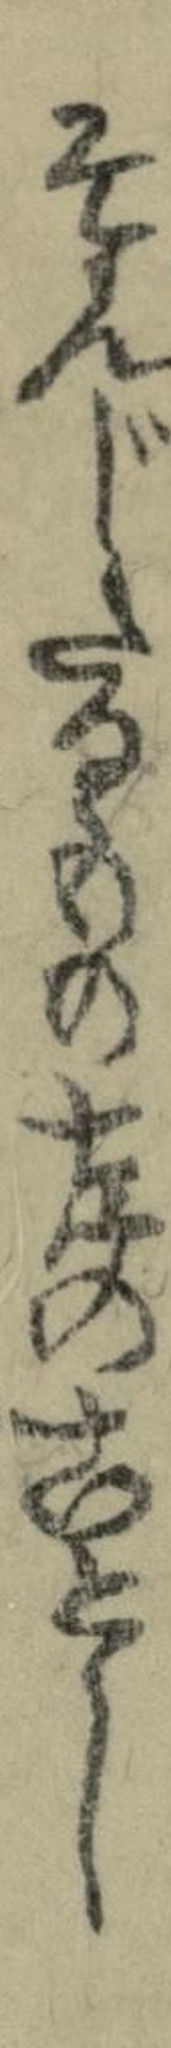そんじたるもの左のことし
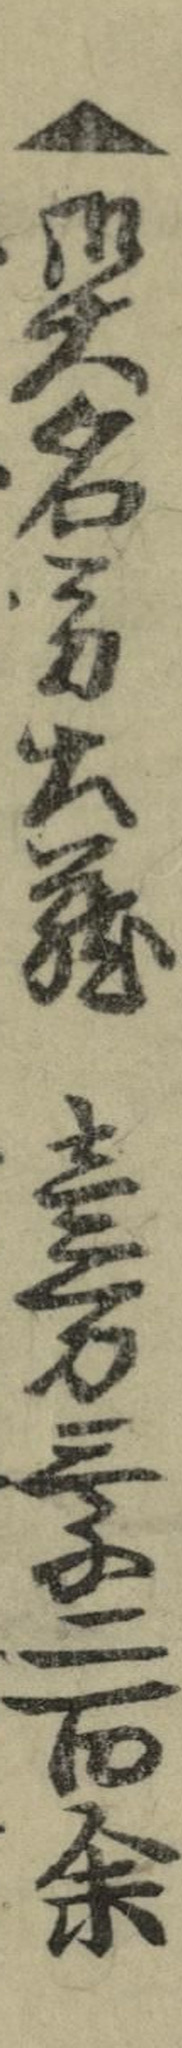▲御大名方土蔵壱万三千二百余
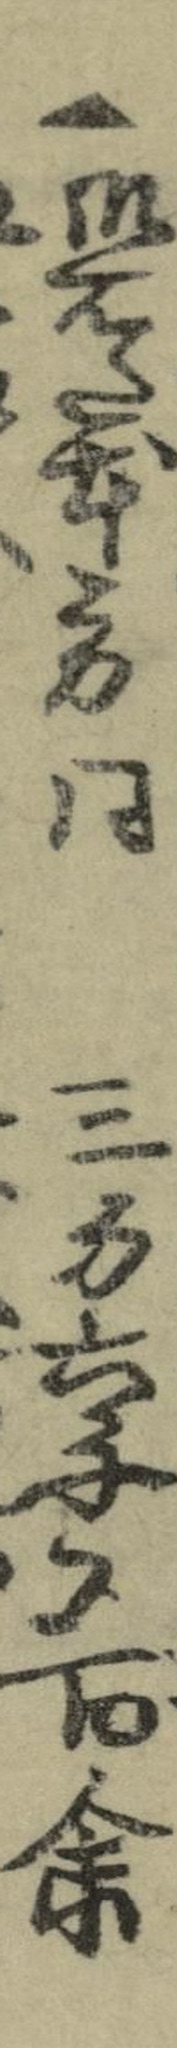▲御はた本方同三万六千五百余
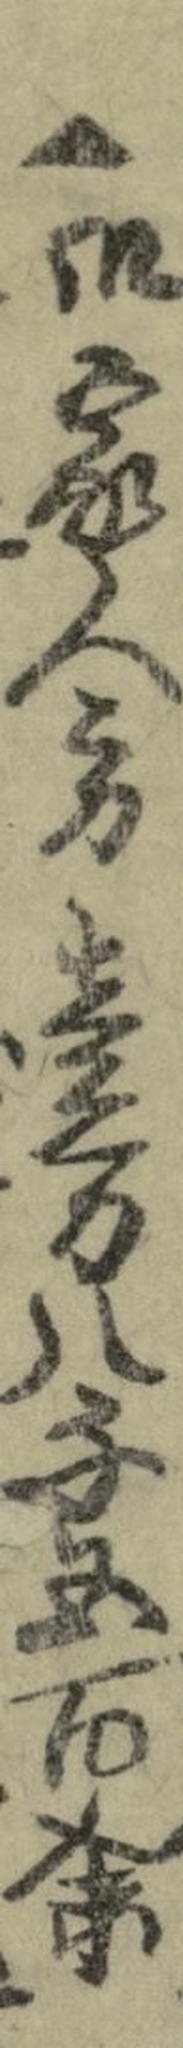▲御家人方壱万八千五百余
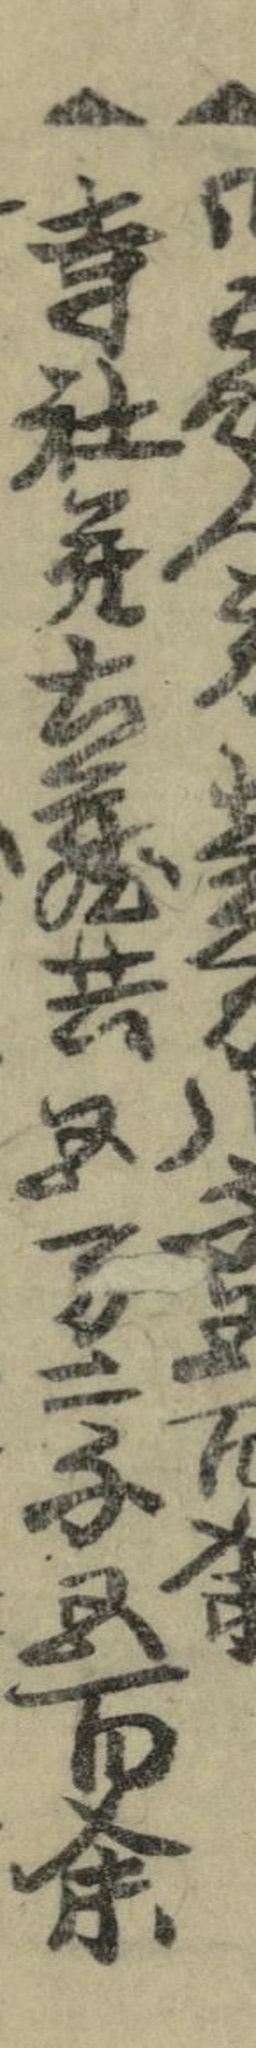▲寺社幷土蔵共五万二千五百余
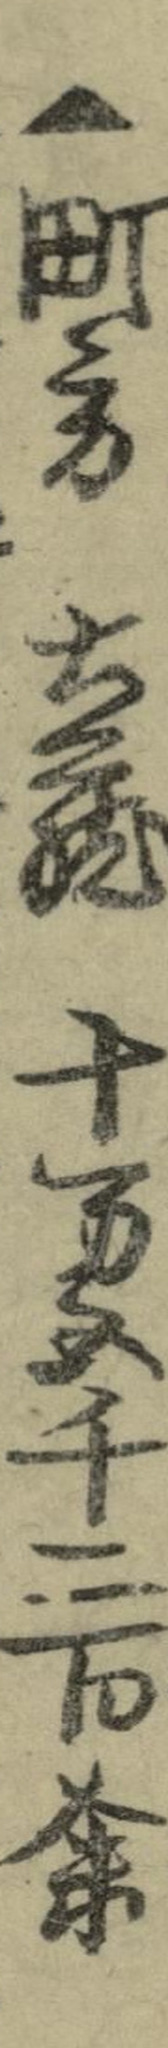▲町方土蔵十万五千二百余
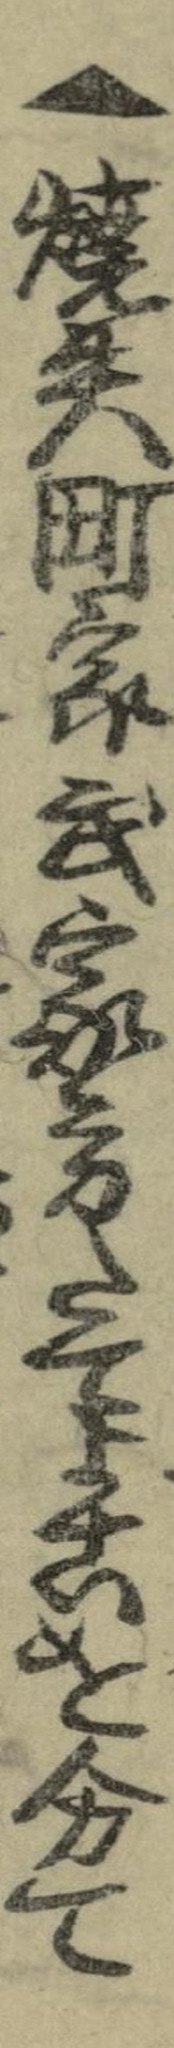▲焼失町家武家方たてよこを分て
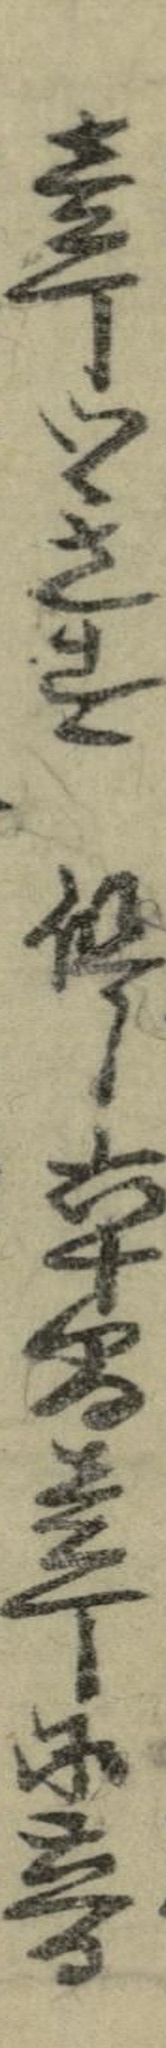壱丁つゝとす但し六十間壱丁に立る
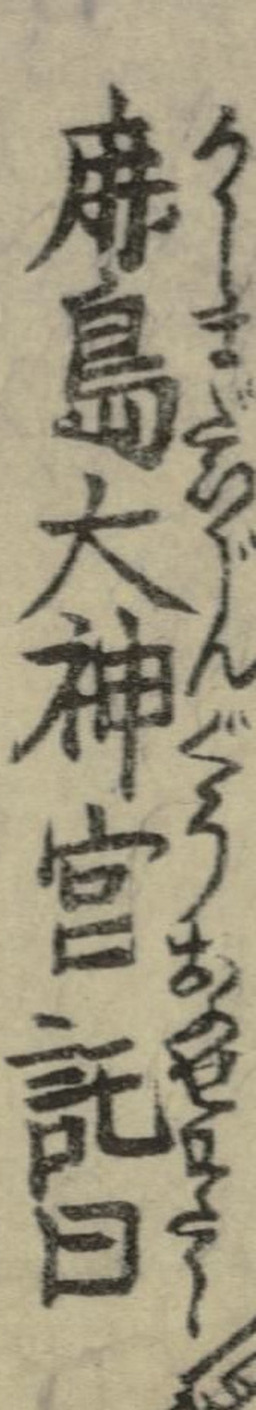鹿島大神宮託曰
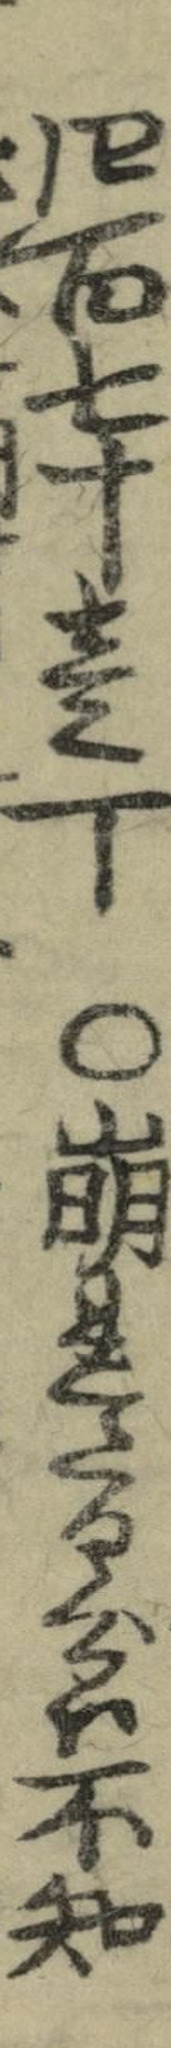四百七十壱丁〇崩れたる分は不知
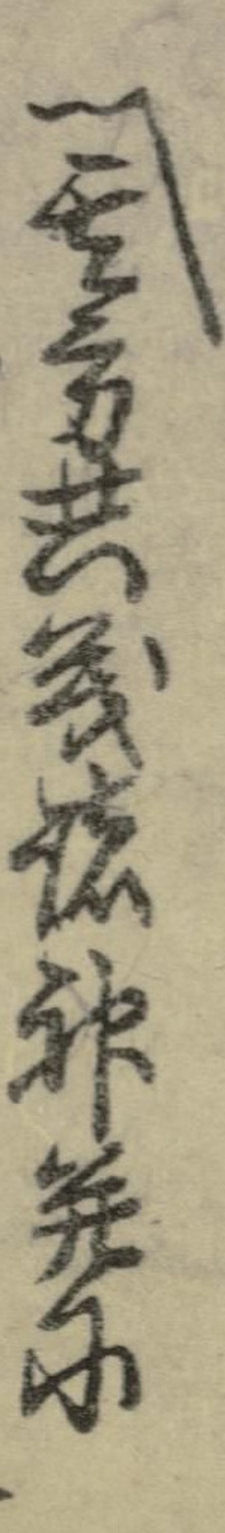〽其方共義諸神幷に
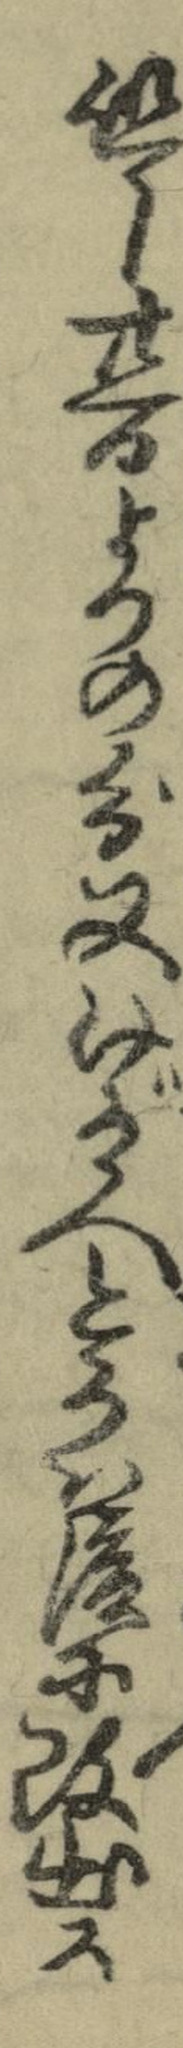但し廿一日よりの分又けが人とうは後に改出ス
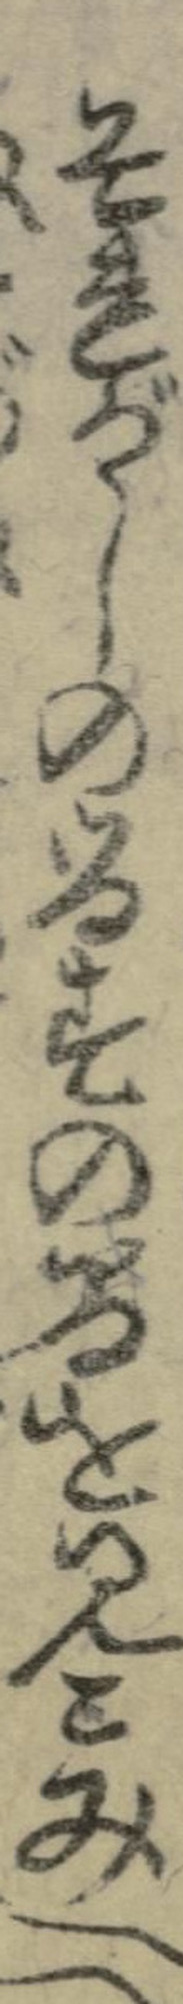それがしの留すの間を見こみ
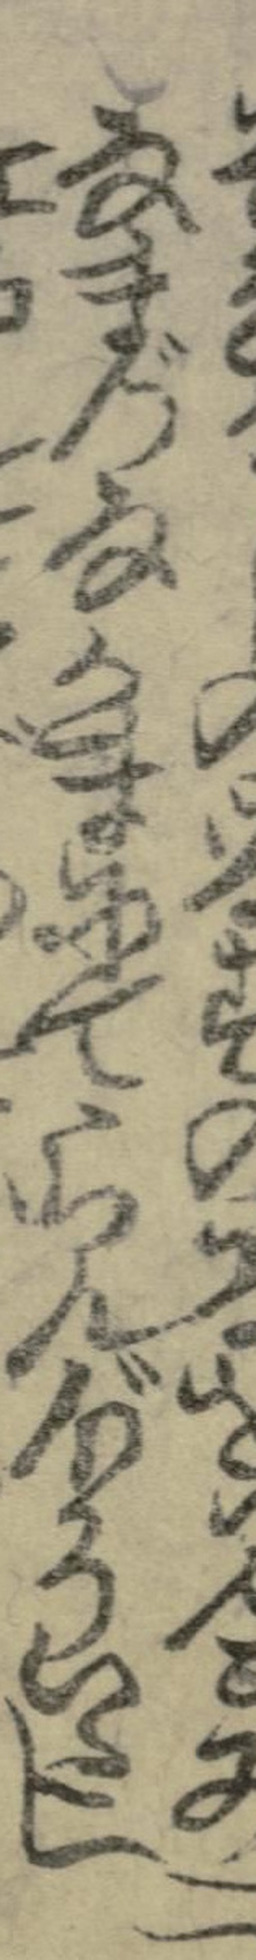なまづなかまにてらんぼういたし
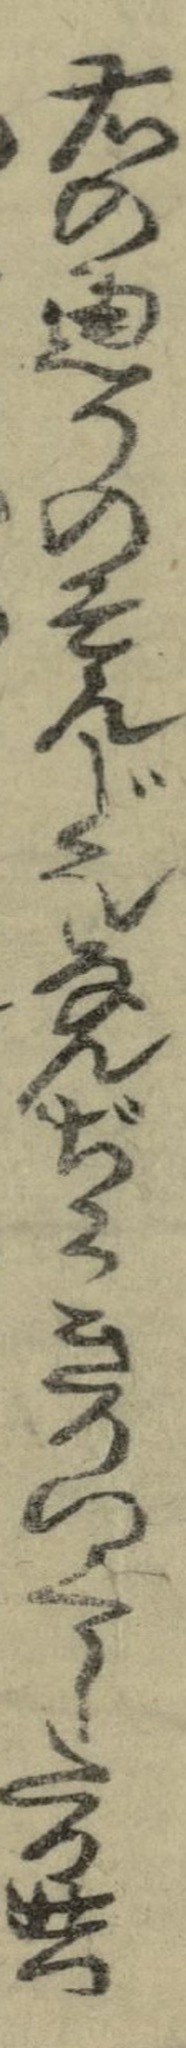右の通りのそんじ也なんぢらきりつくしたり共
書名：鹿島大神宮託曰
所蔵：東京大学地震研究所図書室 Earthquake Research Institute Library, The University of Tokyo, JAPAN
